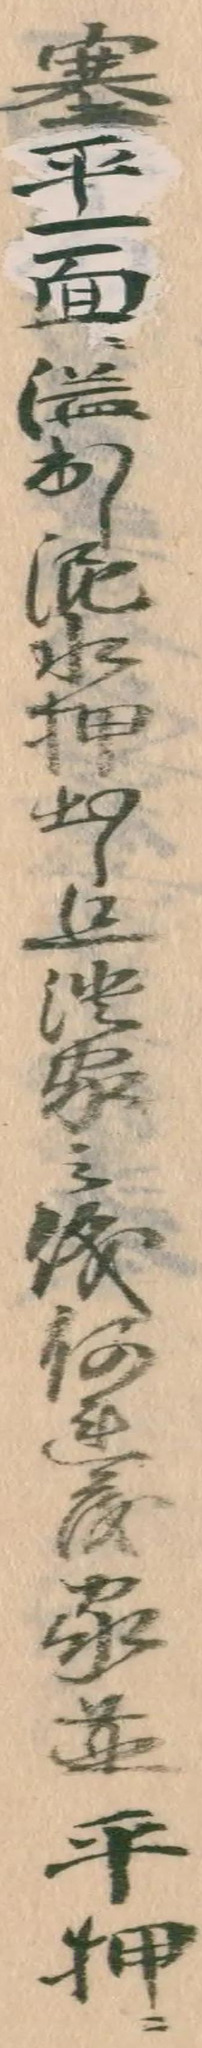塞平一面ニ溢出し泥水押出し且潰家之儀何れも家並平押ニ
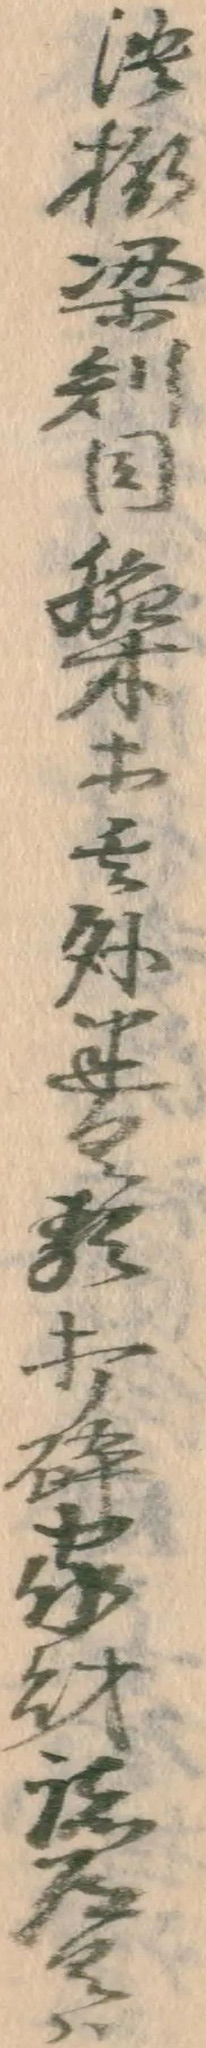潰桁梁矧目臍木等其外建具之類打砕家財諸道具等ハ
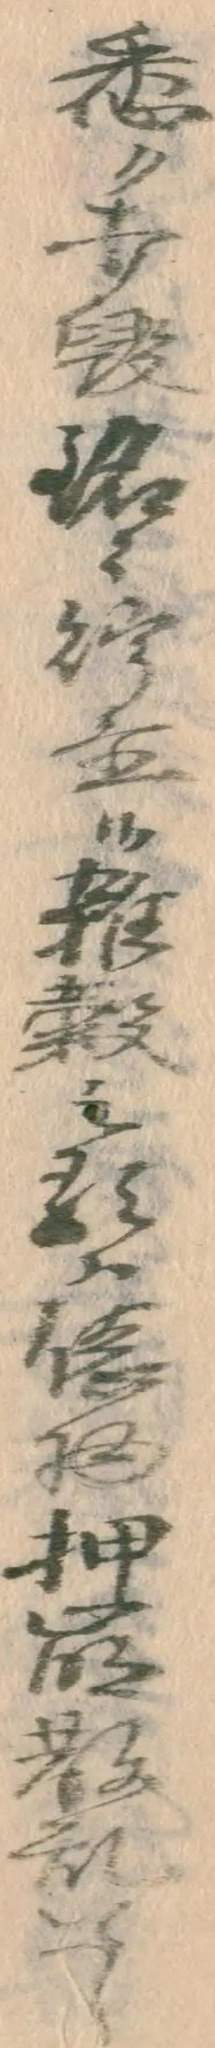悉ク打毀銘々貯置候雑穀之類ハ俵物押崩散乱いたし
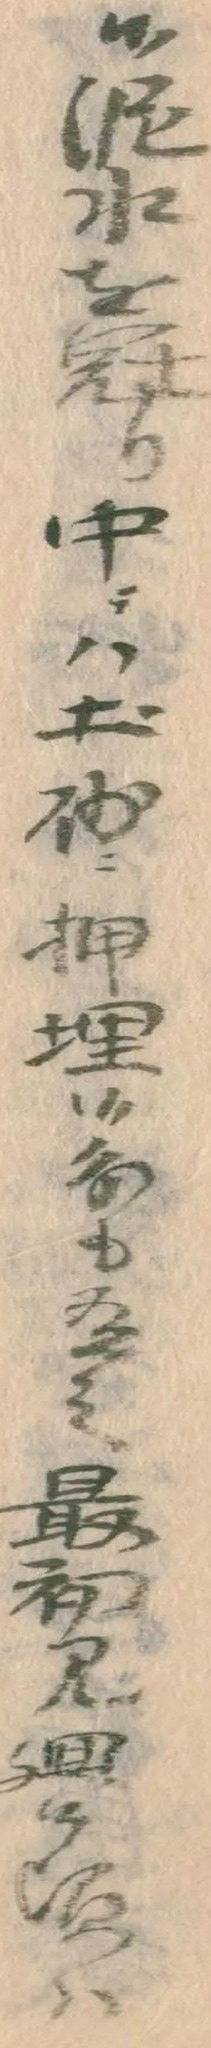候泥水を冠り中二ハ土砂二押埋候分も有之最初見廻り候頃ハ
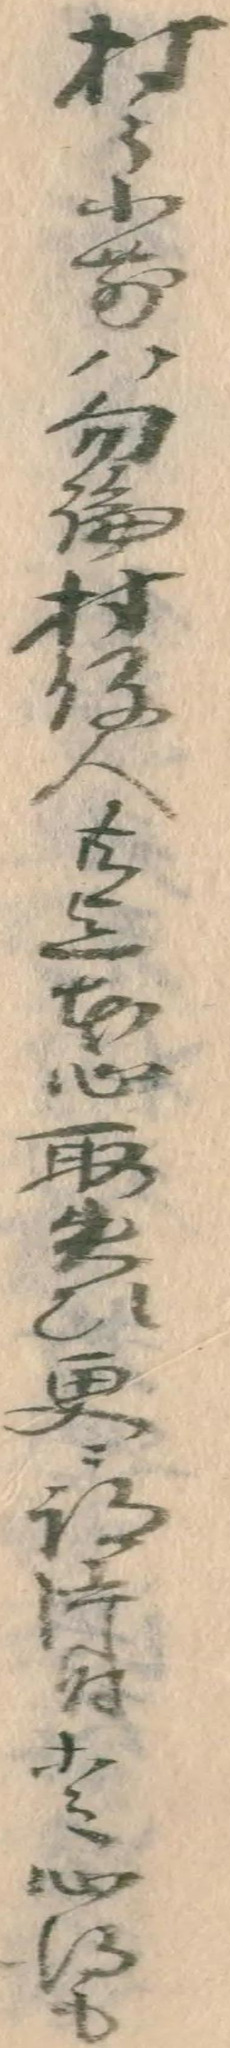村々小前ハ勿論村役人共迄本心取失ひ更ニ跡片付等之心得も
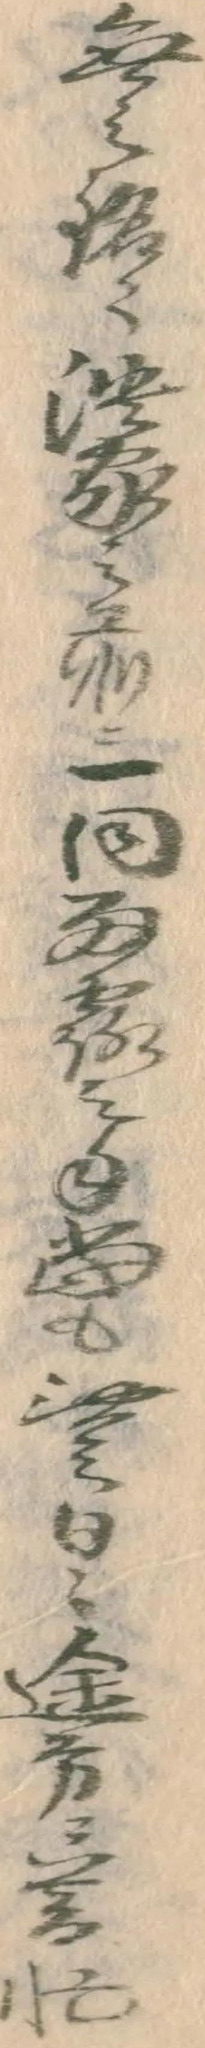無之銘々潰家之前ニ家内一同雨露之手当も無之日々途方ニ暮忙
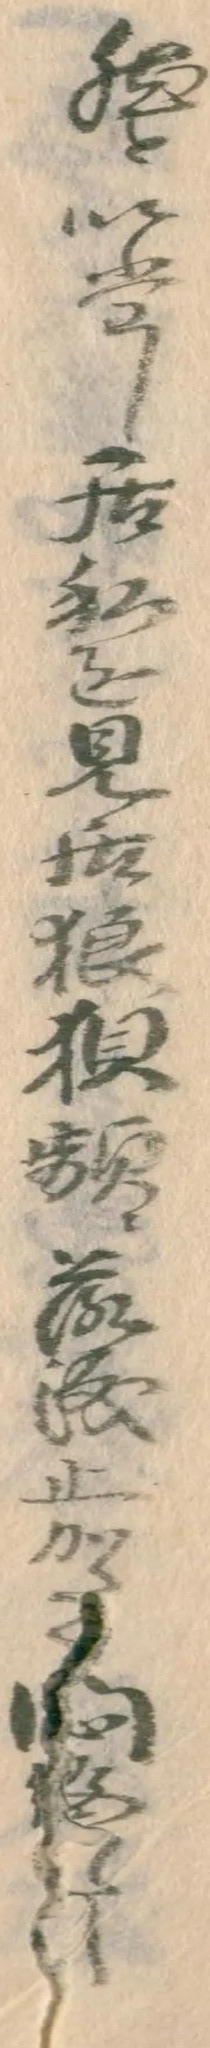然といたし居私を見居狼狽頻二落涙止かたく悶絶いたし
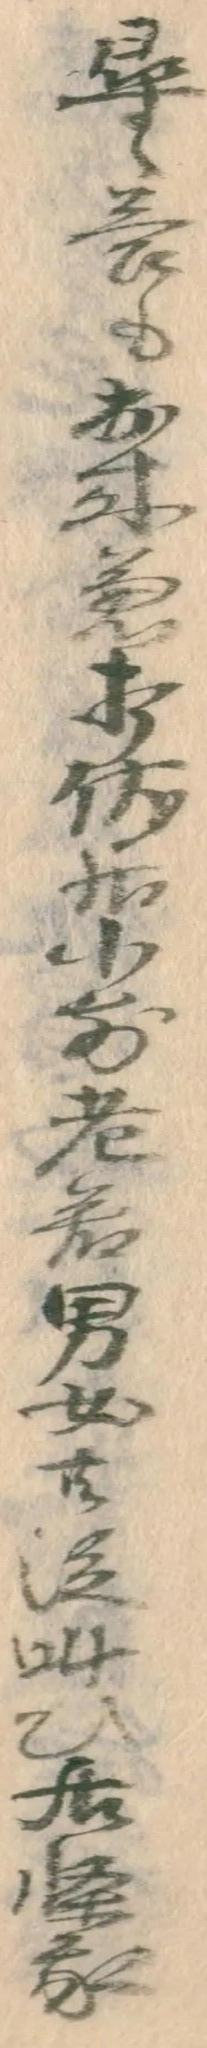尋候答も出来兼打伏居小前老若男女共泣叫び居怪我
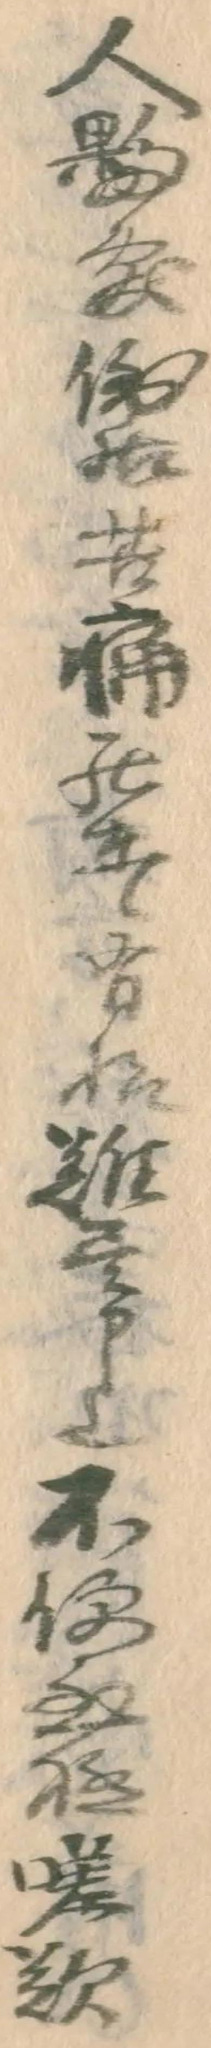人夥敷倒居苦痛罷在有様難尽申上不便至極歎嗟
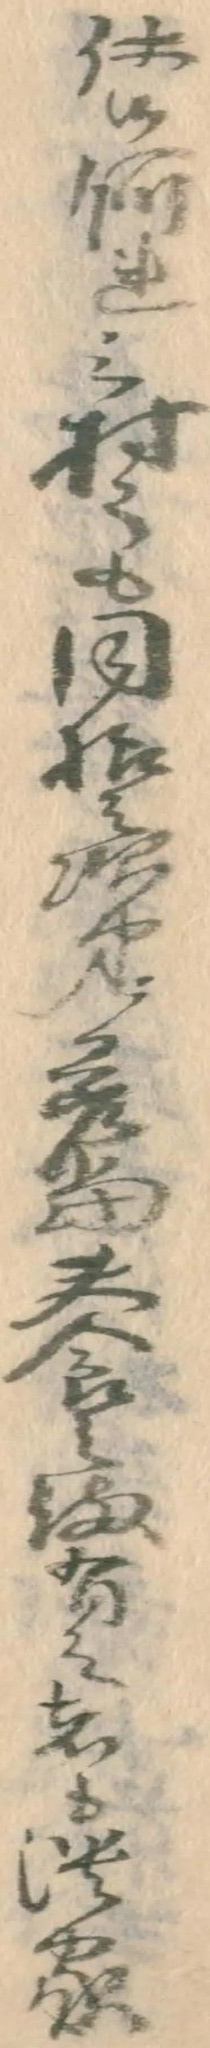仕候何れ之村々も同様之次第ニ而差当夫食備有之者も潰家

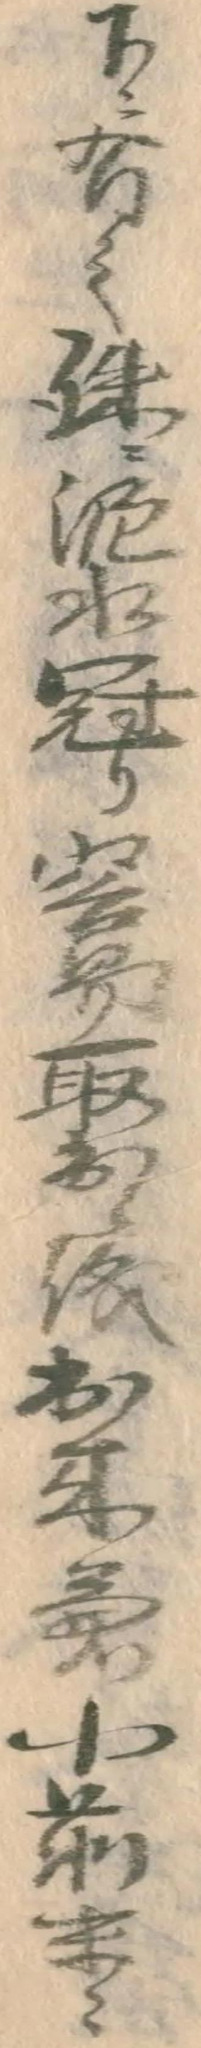下ニ有之殊ニ泥水冠り容易取出候儀出来兼小前未々
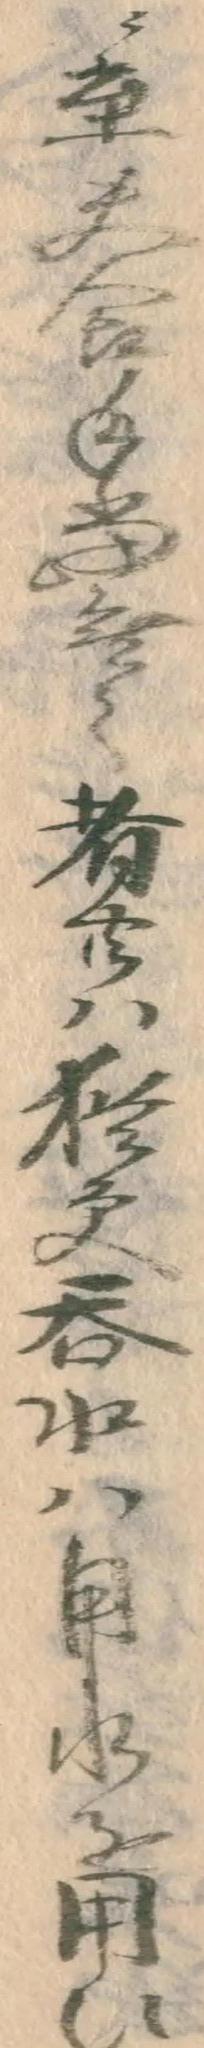ニ至夫食手当無之者共ハ猶更呑水ハ用水ヲ用ひ
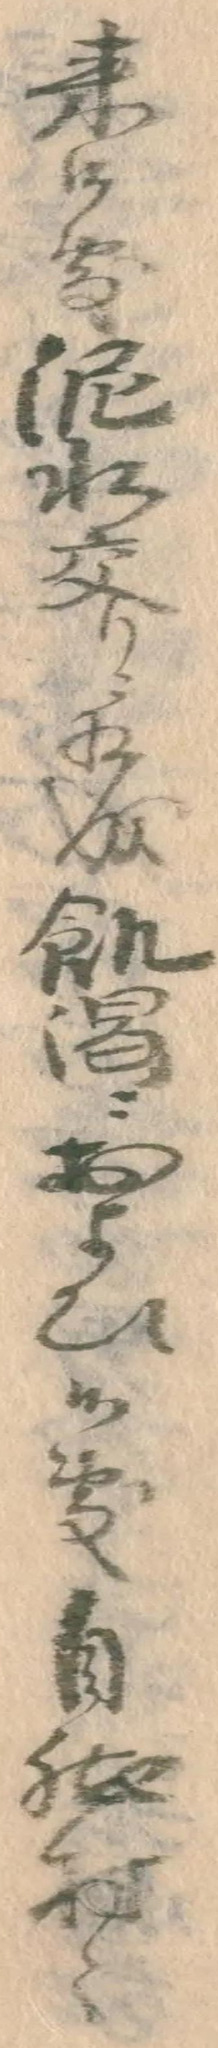来候処泥水交りニ相成飢餲二およひ候処自然村々
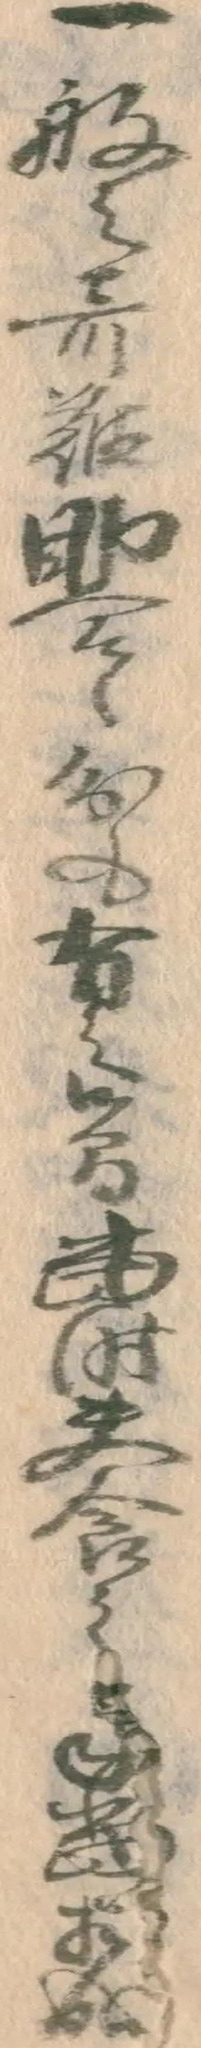一般之奇難助合之分も有之候間当時夫食之手当相成
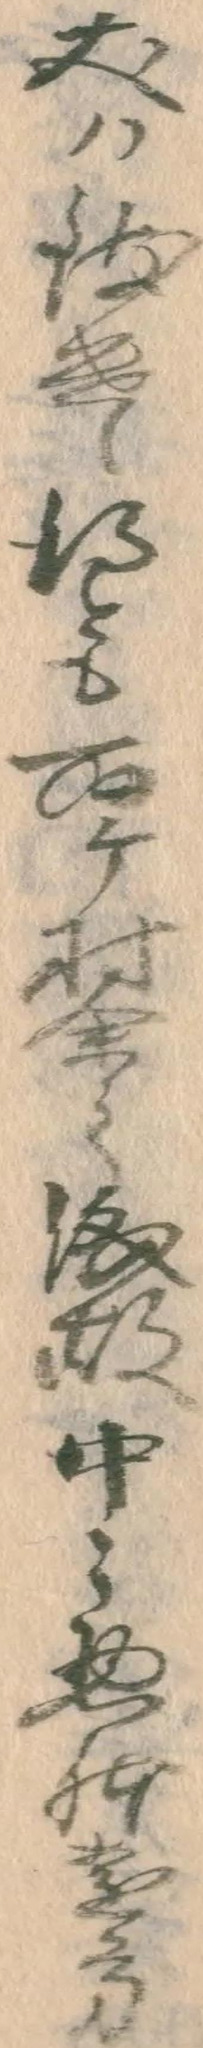丈ハ致遣候得共百ケ村余之儀故中々惣躰遠方
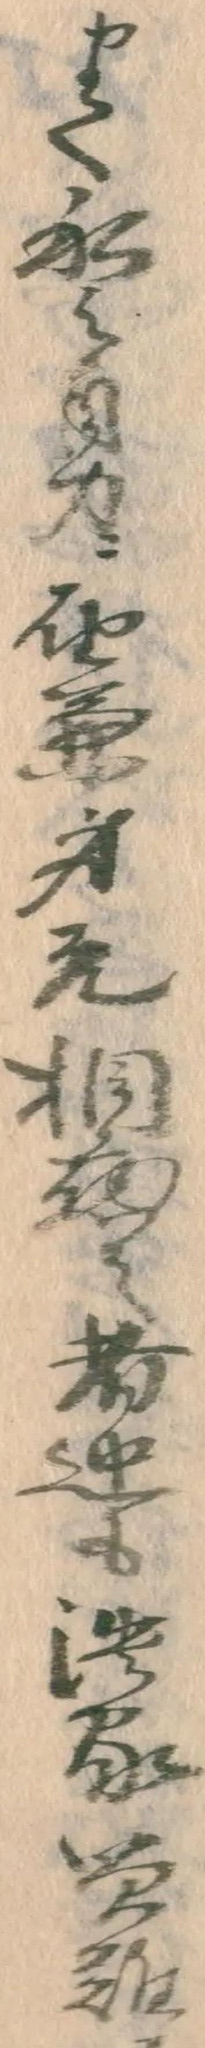まで私之自力ニ届兼身元相応之者共迚も潰家災難ニ
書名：信州大地震之記
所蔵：国立国会図書館 National Diet Library, JAPAN
